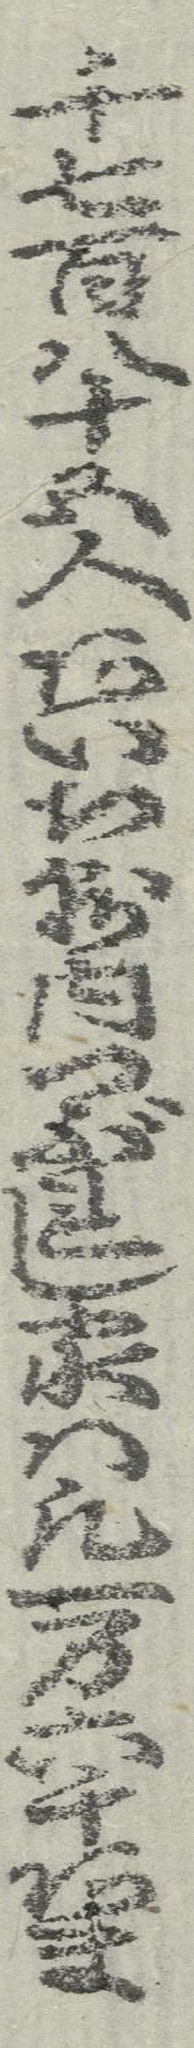千七百八十五人あいち県内つぶれし家は凡一万六千あま
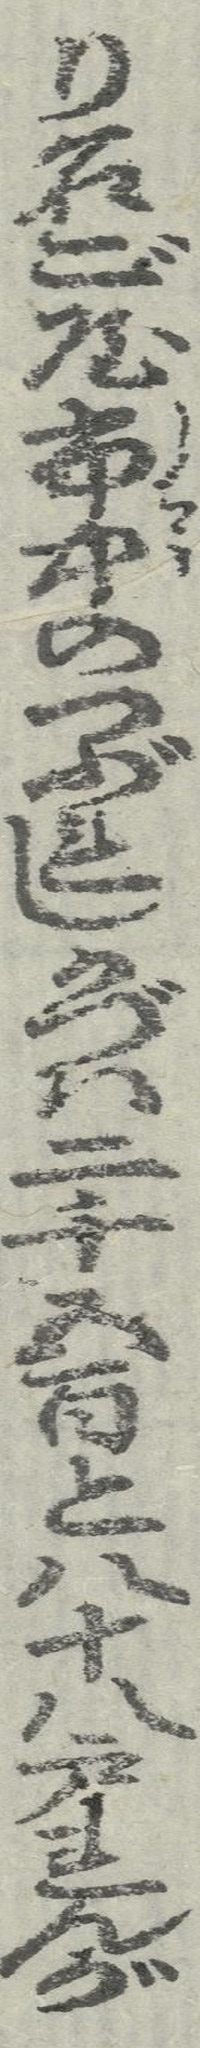り名ご屋市中のつぶれかづは二千五百と八十八戸れんが
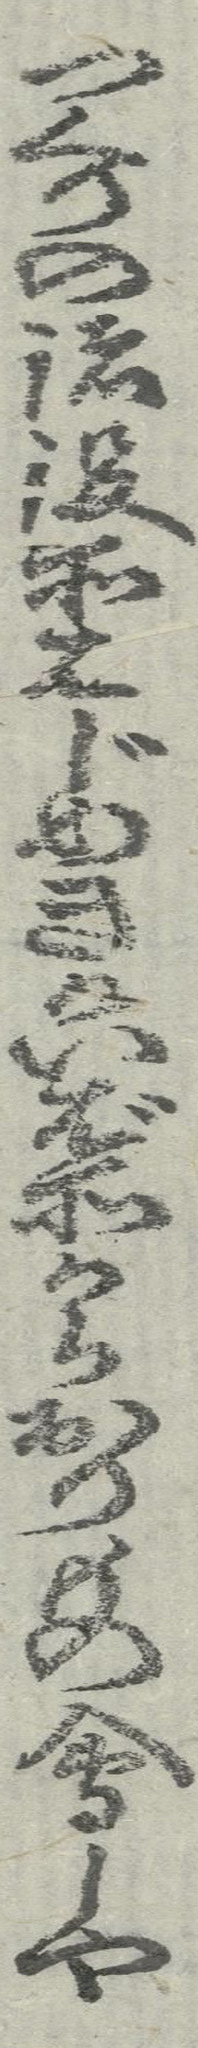つくりの諸設所はじめきかいば所からおりもの会しや
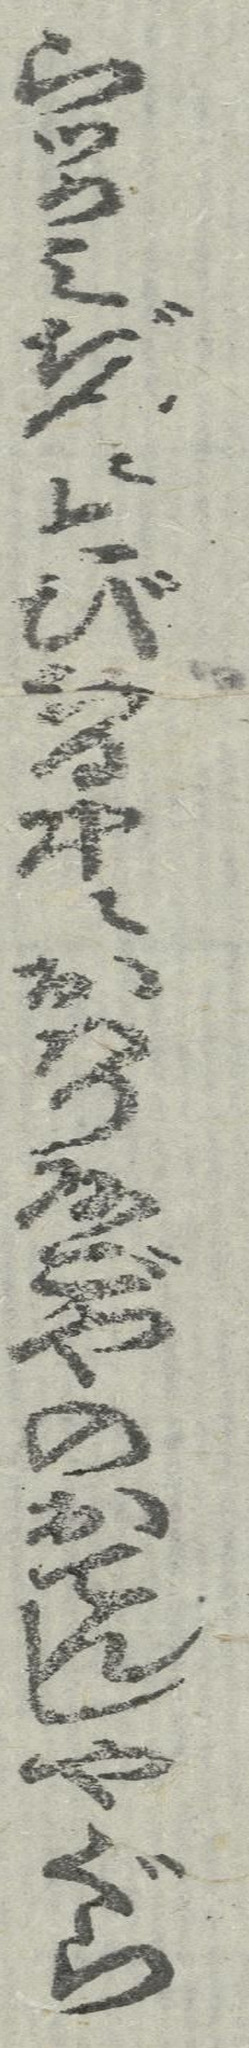らツかみぢんニとびちる中ニおはりなごやのおてんしやぐら
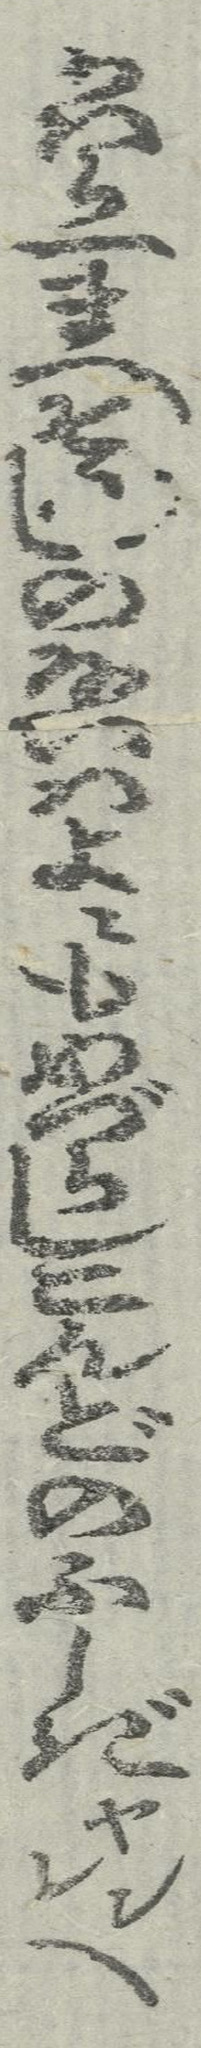かはら一まへそんしのないはよニもめづらしこんどのふしぎヤンレヘ

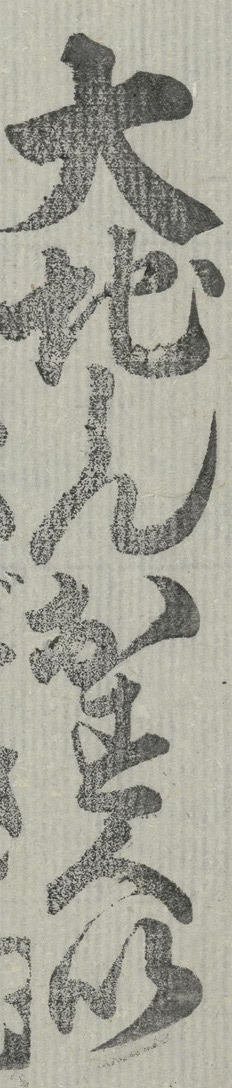大地しんおすくい
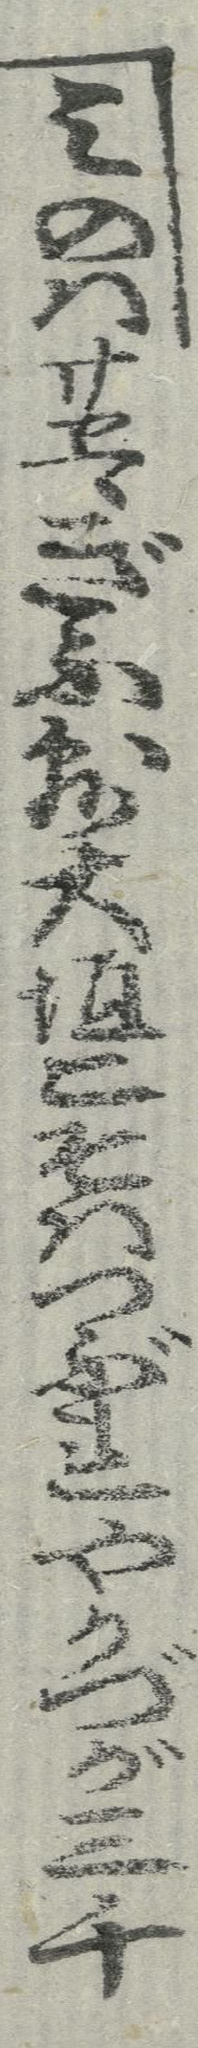〽みのはサヱヽぎふ県大垣こそはつぶれやかづが三千
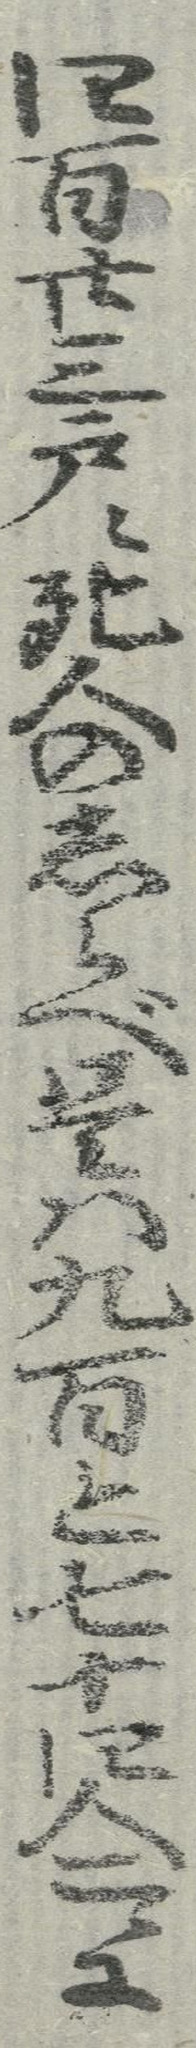四百廿三戸ニ死人のしらべ是は九百と七十四人こゝに
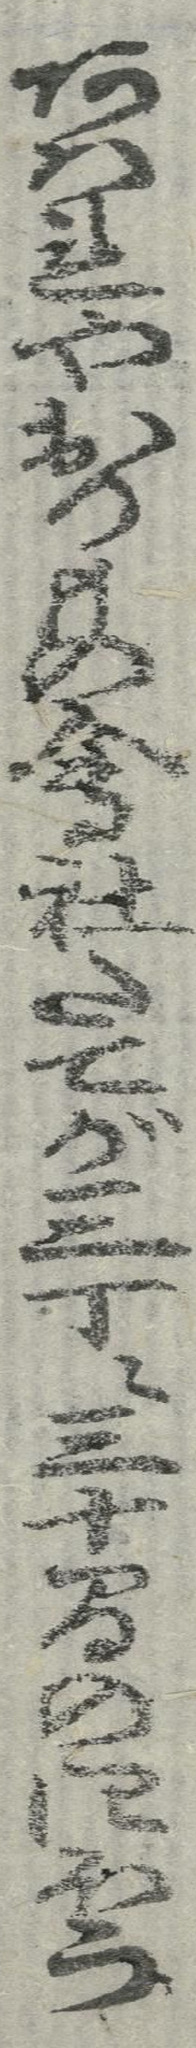あはれやおりもの会社たてが三丁ニ三十間の四ほう
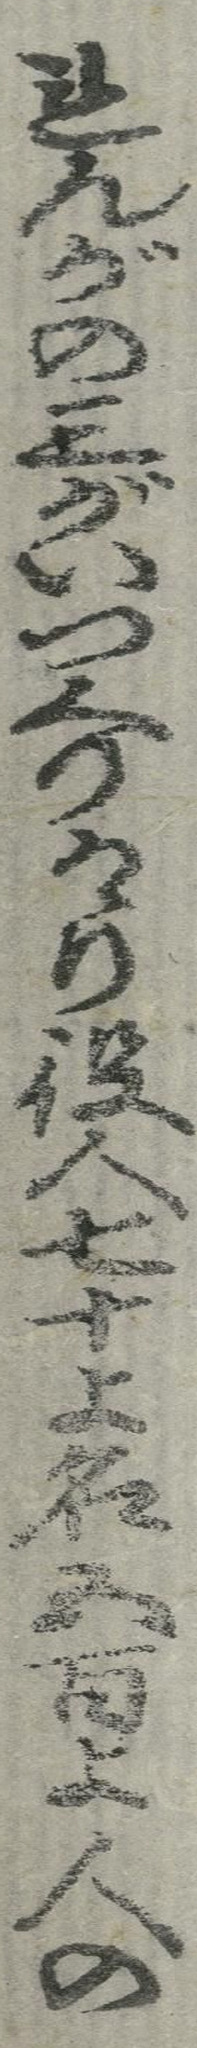れんがの三がいつくりけり役人七十よ名五百よ人の
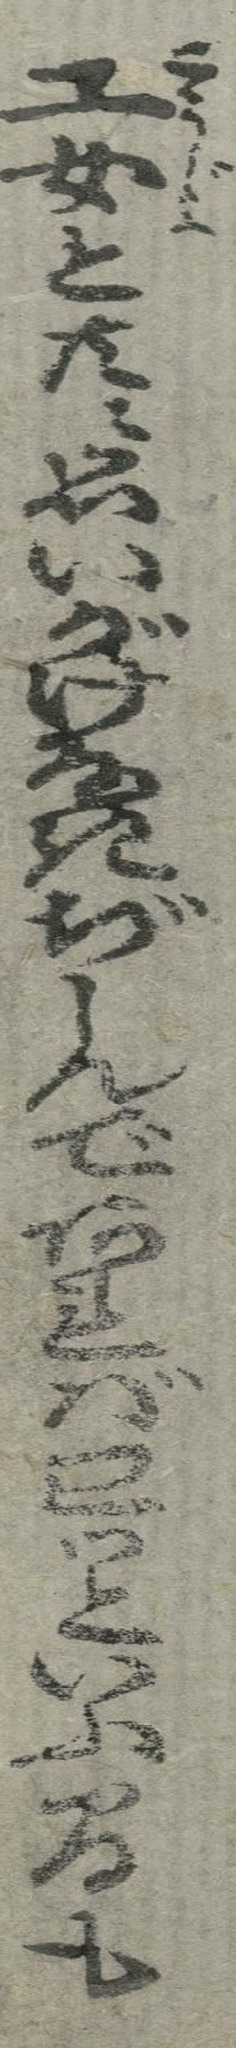工女と共ニ思いがけなきぢしんであればわツといふ間も
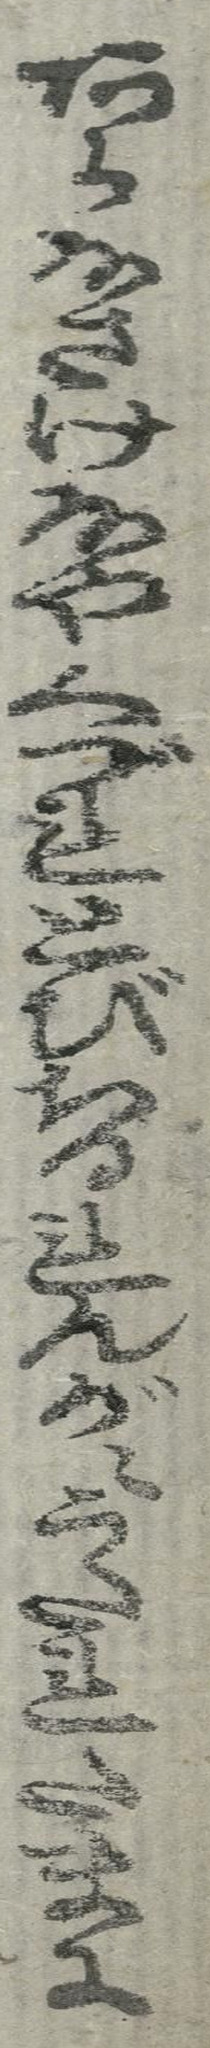あらなさけなやくづれとびちるれんがニうたれたまに
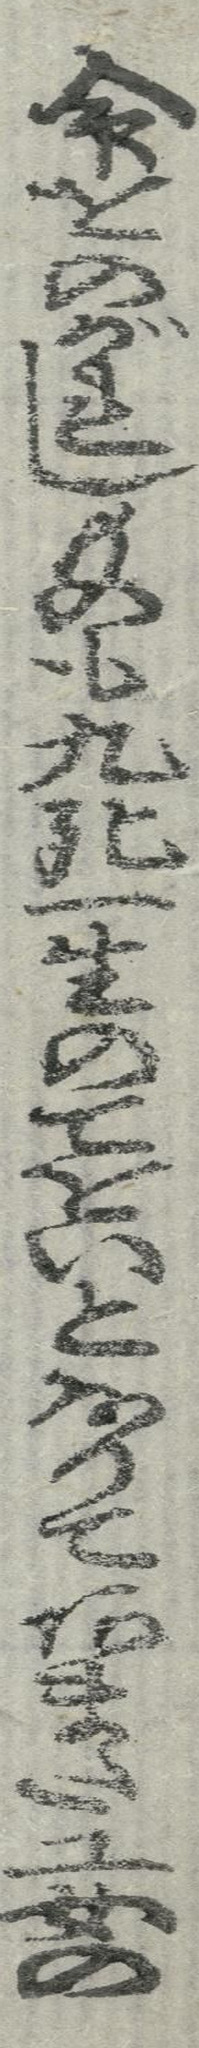命をのがれしものも九死一生のてをいとなりてあまた工女の
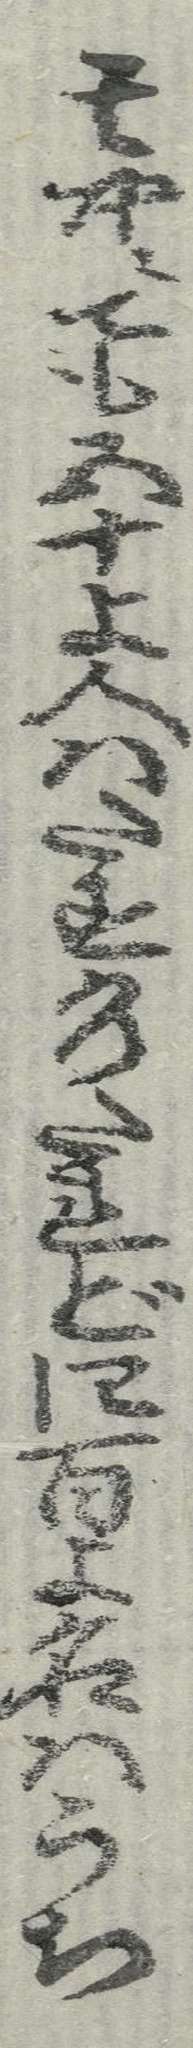其中ニても五十よ人はたすかりたれど四百よ名はうち
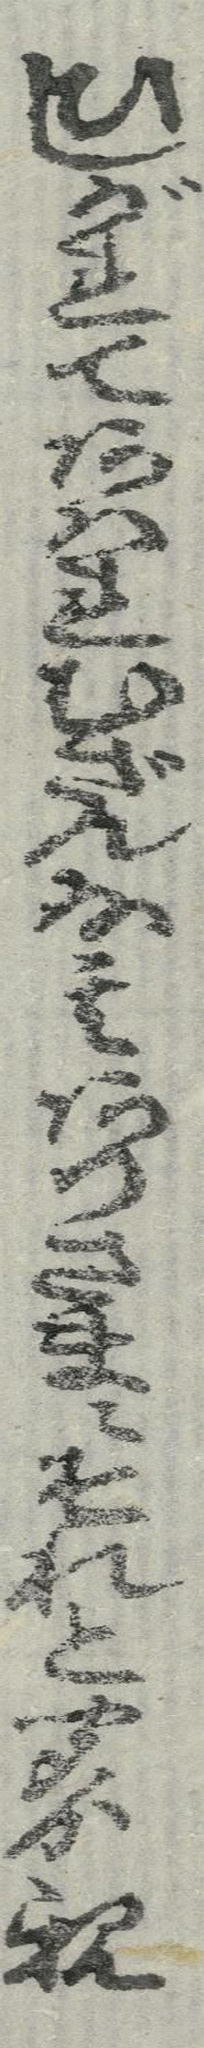ひしがれてあはれむざんな其ありさまニそれと聞ゟ親
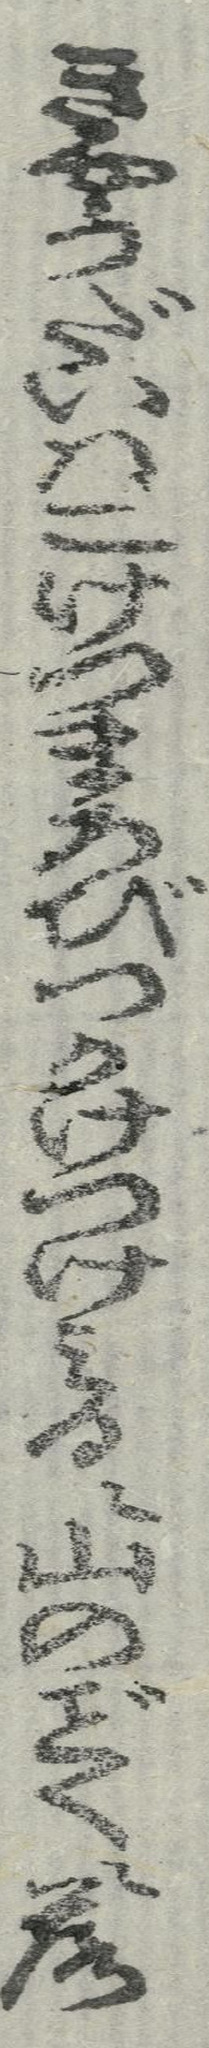きやうだいはこけつまろびつかけつけみるニ山のごとくニ落
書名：十二ヶ国大地しんくどき
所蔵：東京大学地震研究所図書室 Earthquake Research Institute Library, The University of Tokyo, JAPAN
